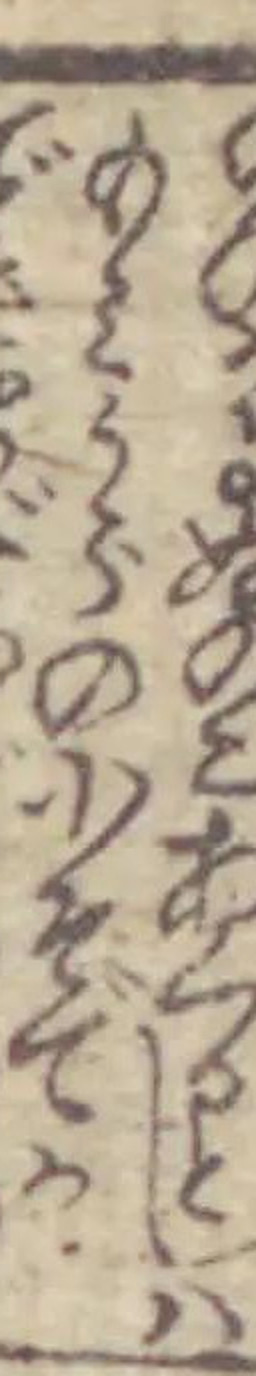もみうらの小そでか
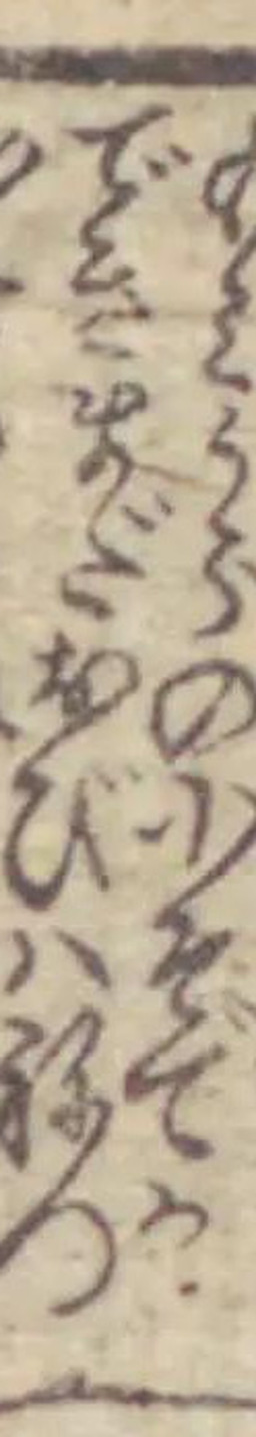できまだおびはねつ
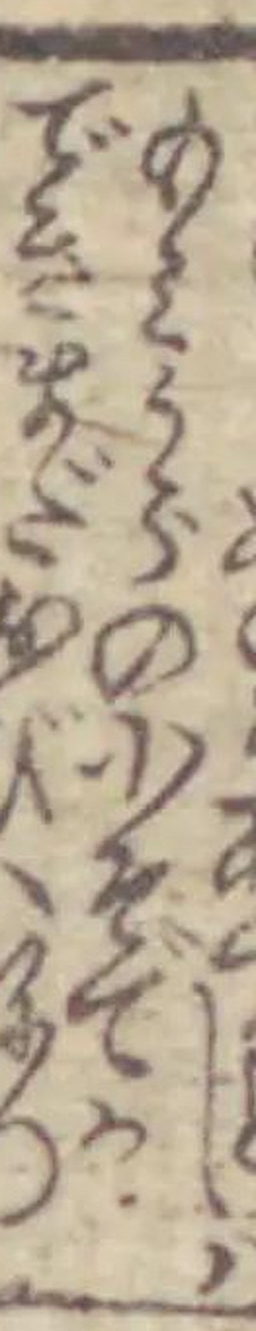できまだおびはねつ
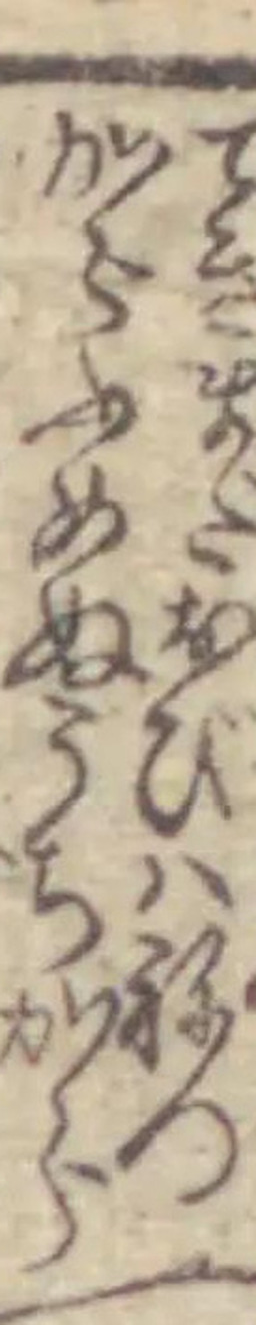からふめぬうちから
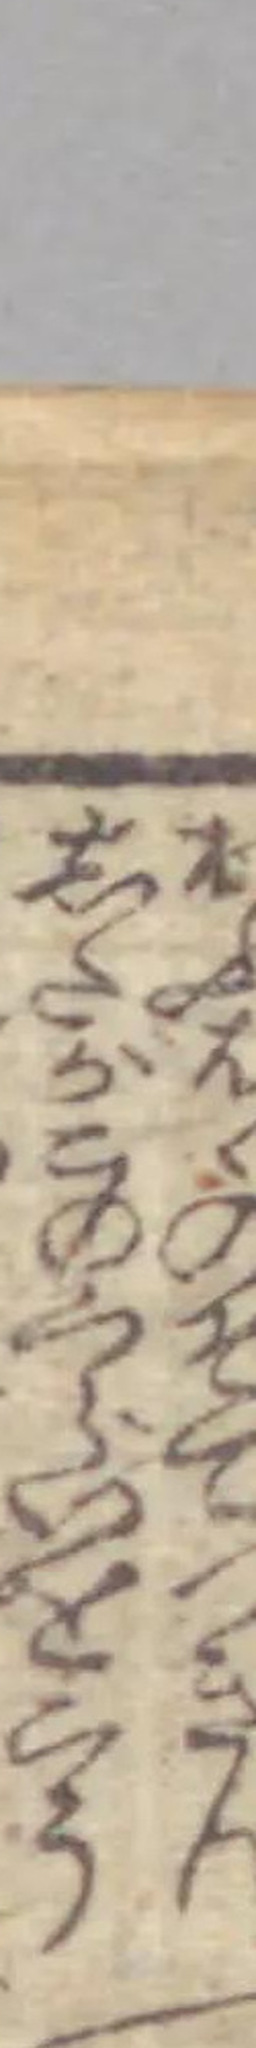したがこのくらいをこう
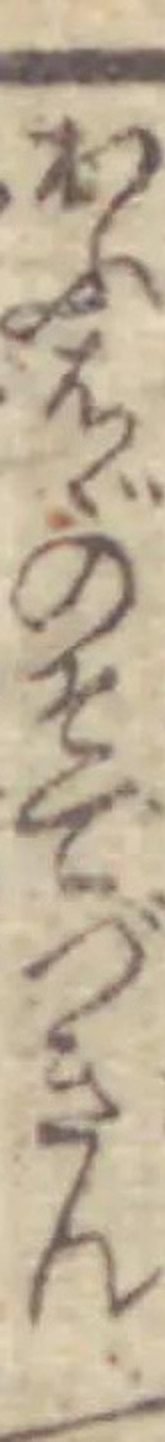おふはゞのそでづきん
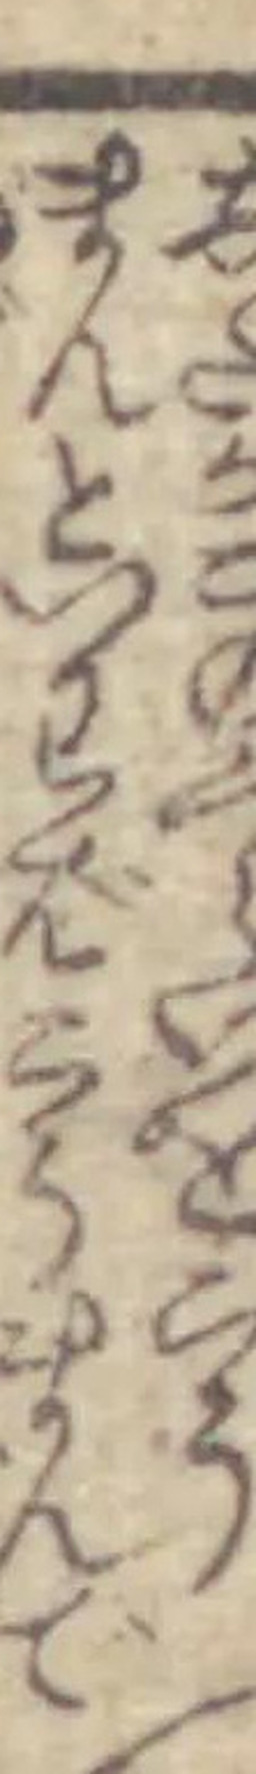まんといわばこうまんで
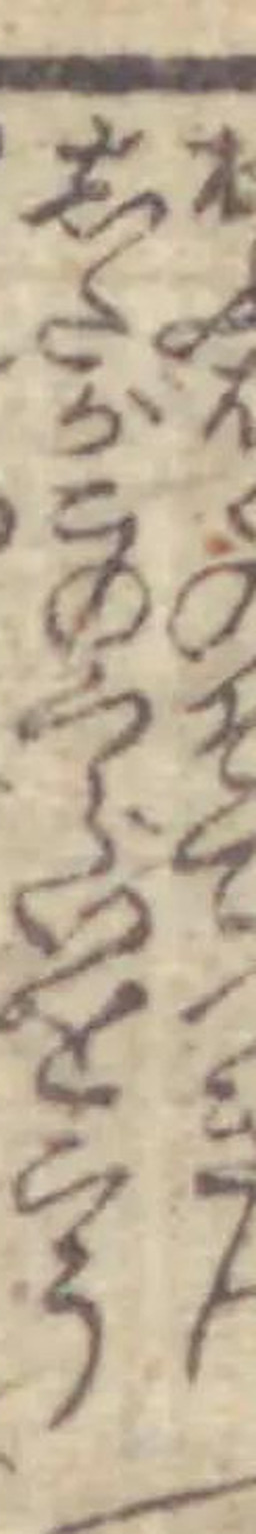したがこのくらいをこう
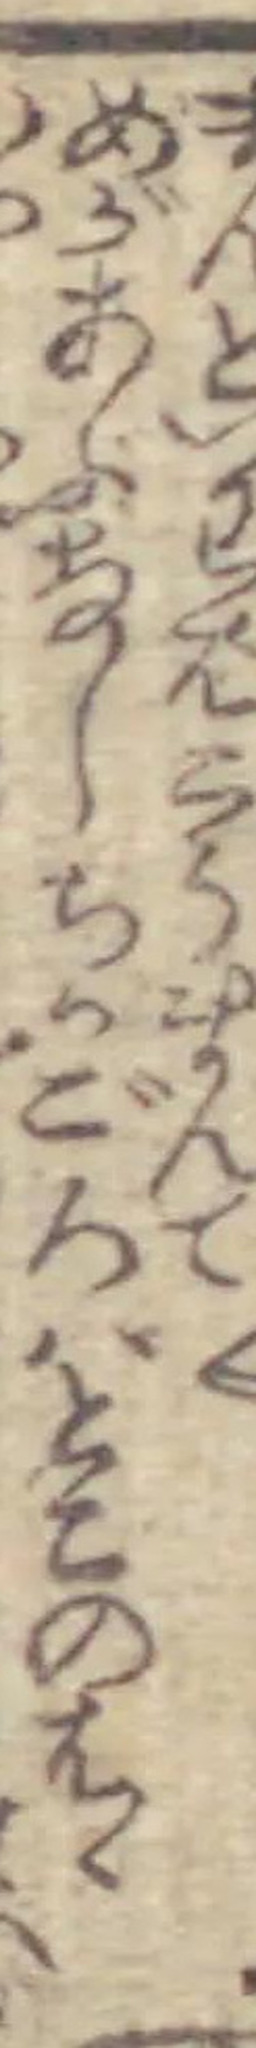めがあぶなしちかごろはとこのはゝ
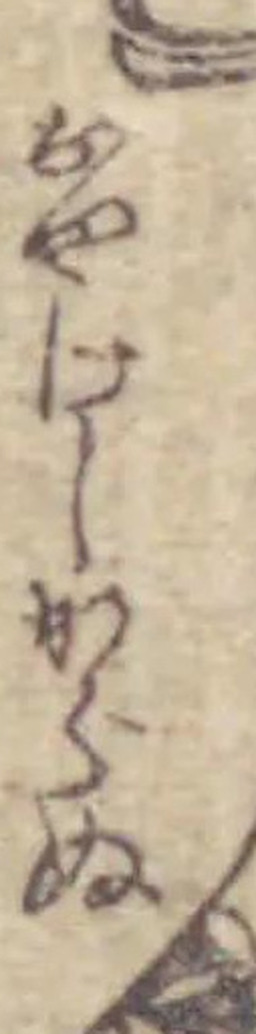おやけしからぬ
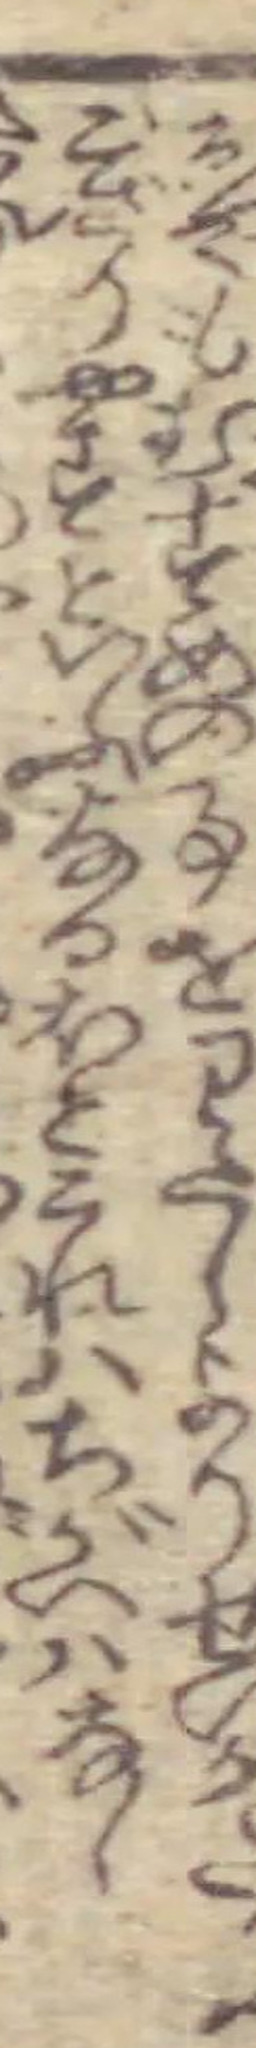ござりやすといふなるほとこれはちがいはなし
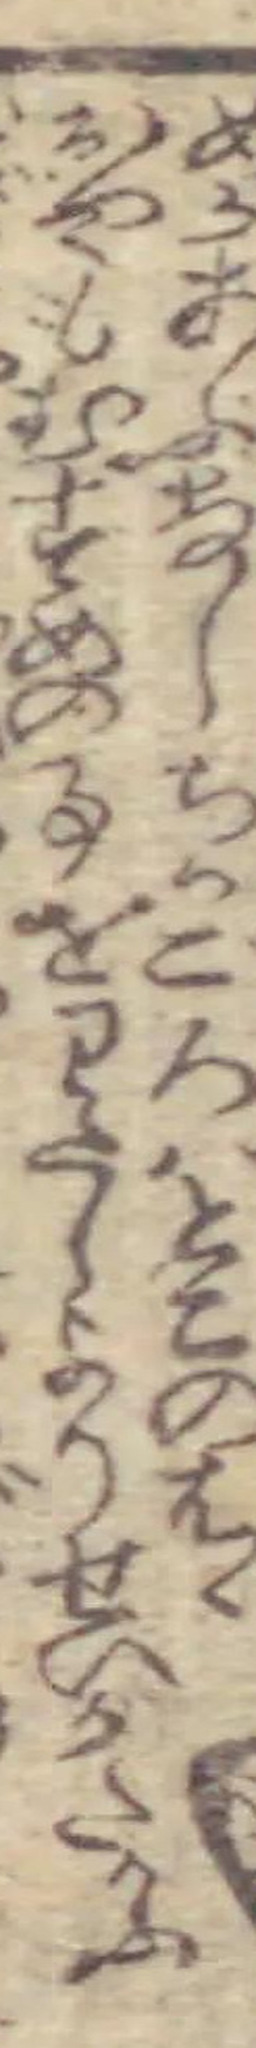おやもむすめの事をわらしよりせいかたかふ
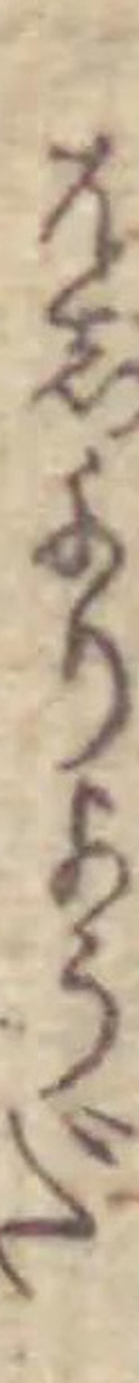はしよりようだ
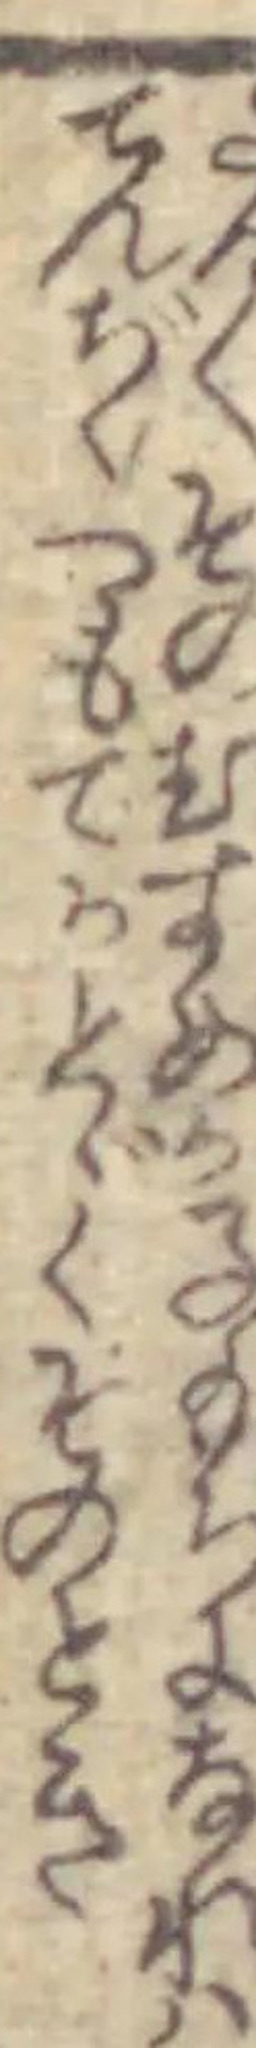てんぢくへもてかとゞくそのとき
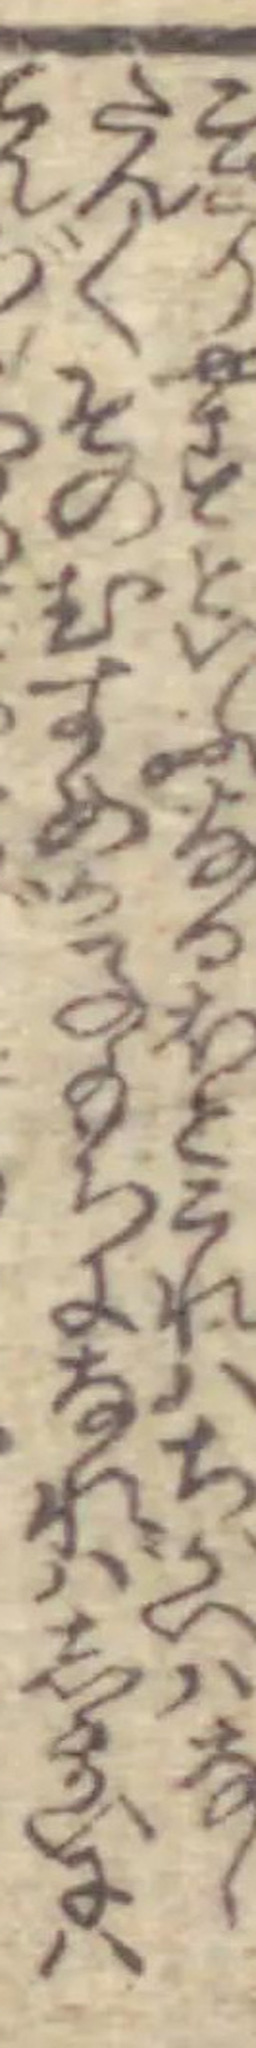たん〳〵そのむすめか子もちになればしまいには
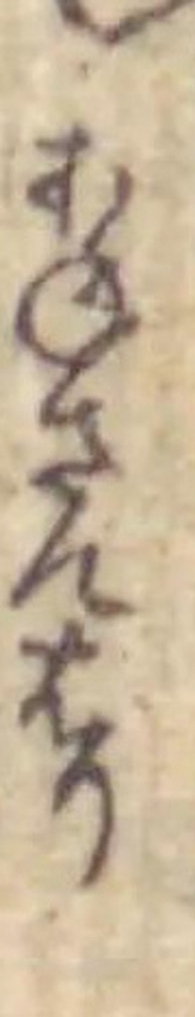あねさんはり
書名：珍説女天狗 2巻
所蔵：国立国会図書館 National Diet Library, JAPAN
